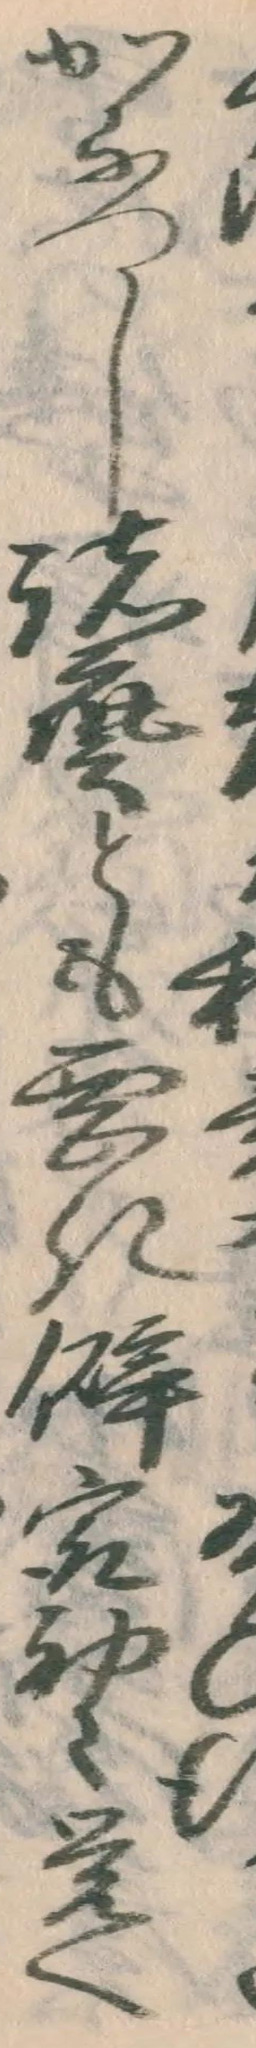かるへし諸藝とも悪き僻最初ニ覚へ
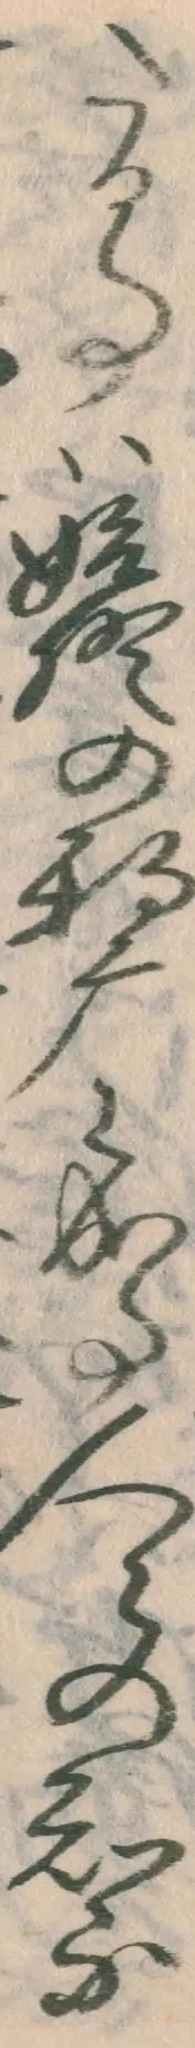たる事ハ始終の邪魔ニ成事人々の知る
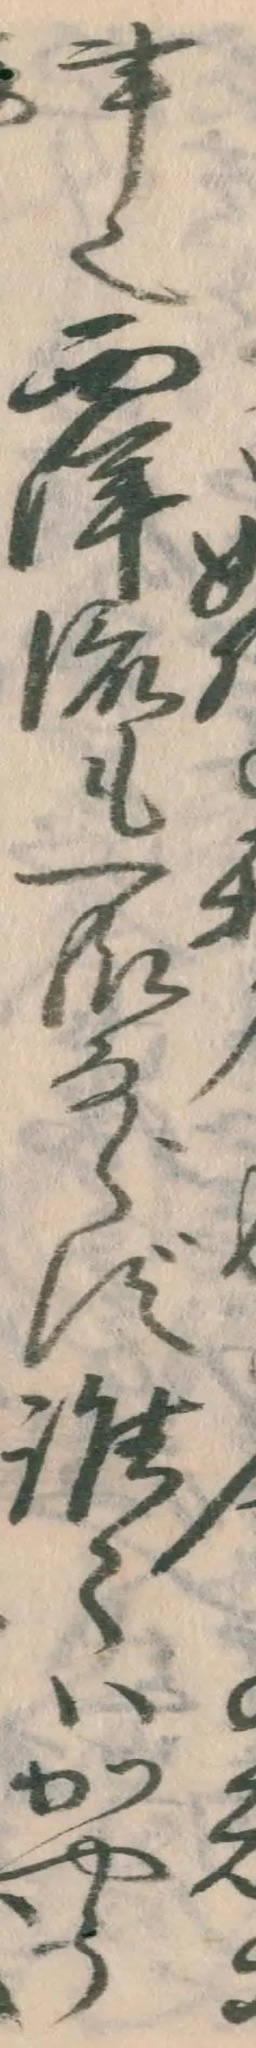事也西洋流も一様ならず誰々ハかやう
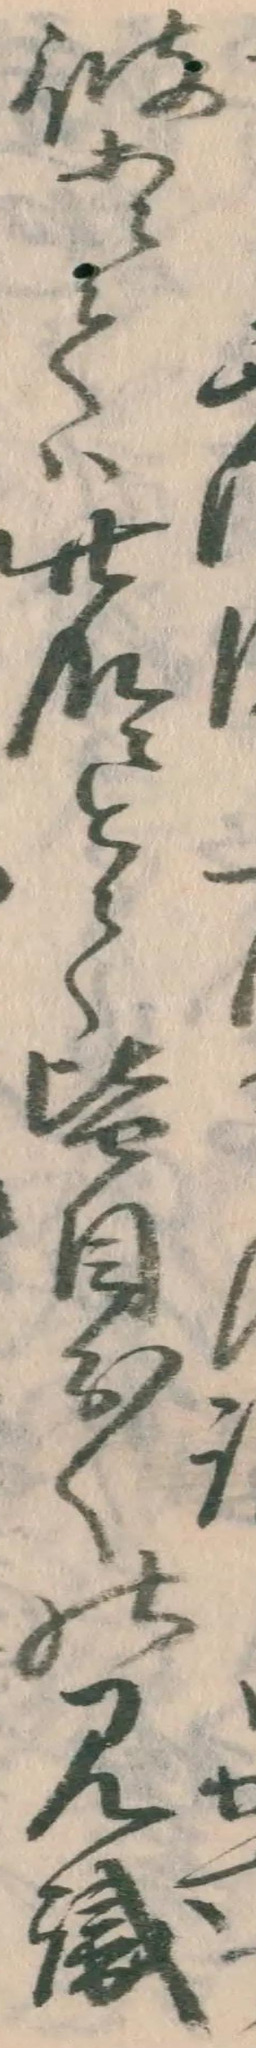彼等ニてハ此様ニとて皆自分〳〵の見識
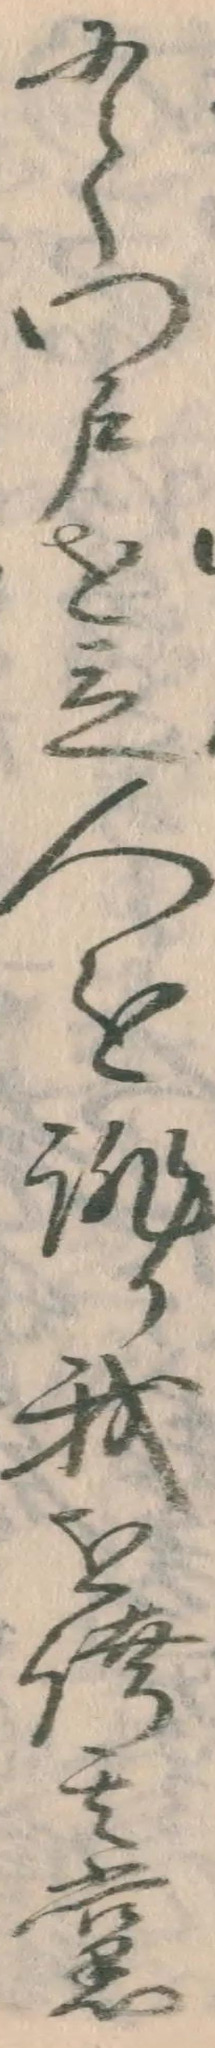にて門戸を立人を誹り我を誇其黨
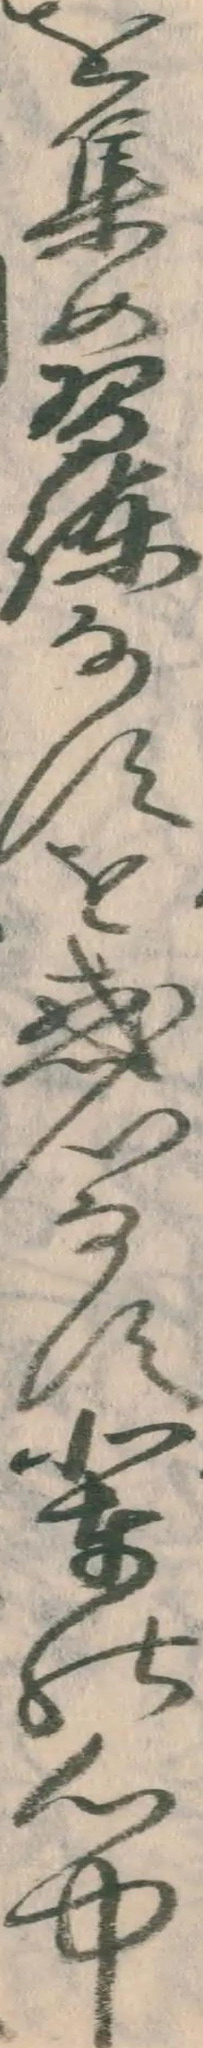を集め習練なすを感心なす輩の心中
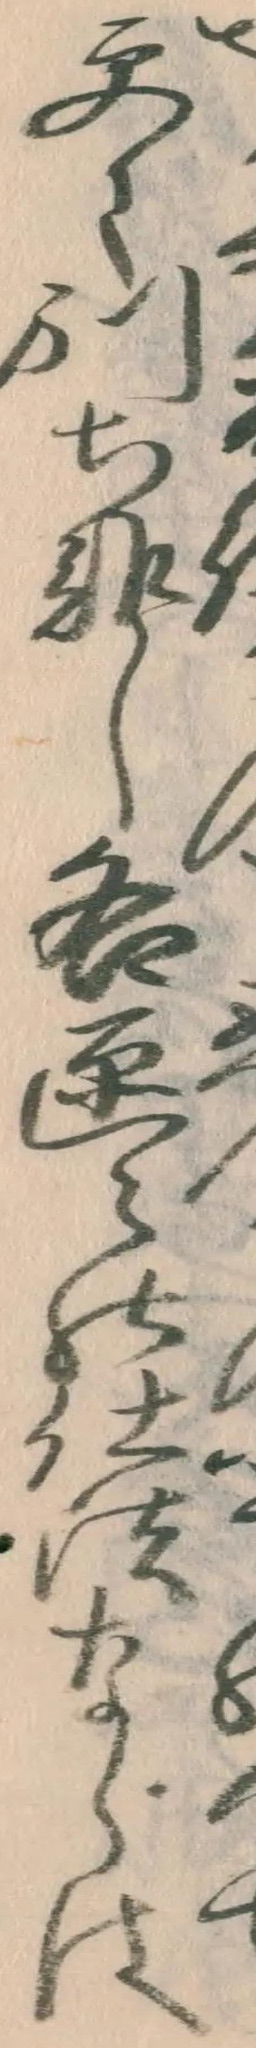更に別ち難し各区々の仕法ならは
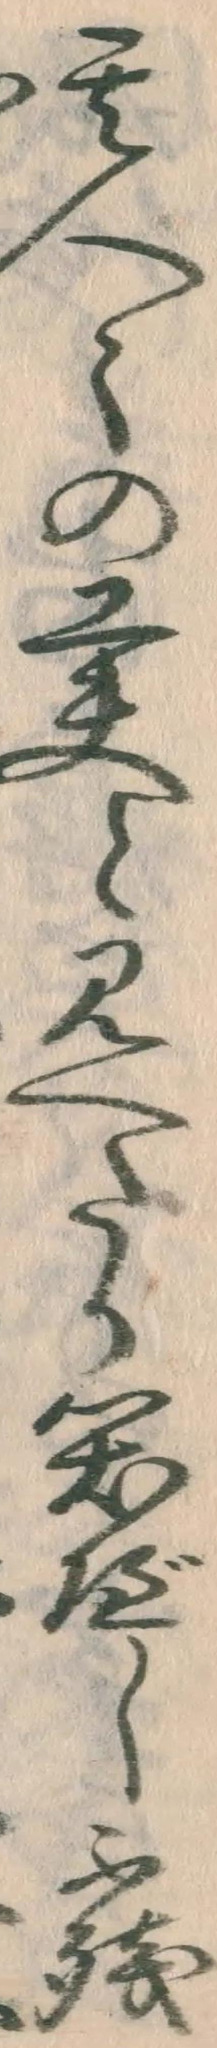其人々の工夫と見へたり笑べし不残
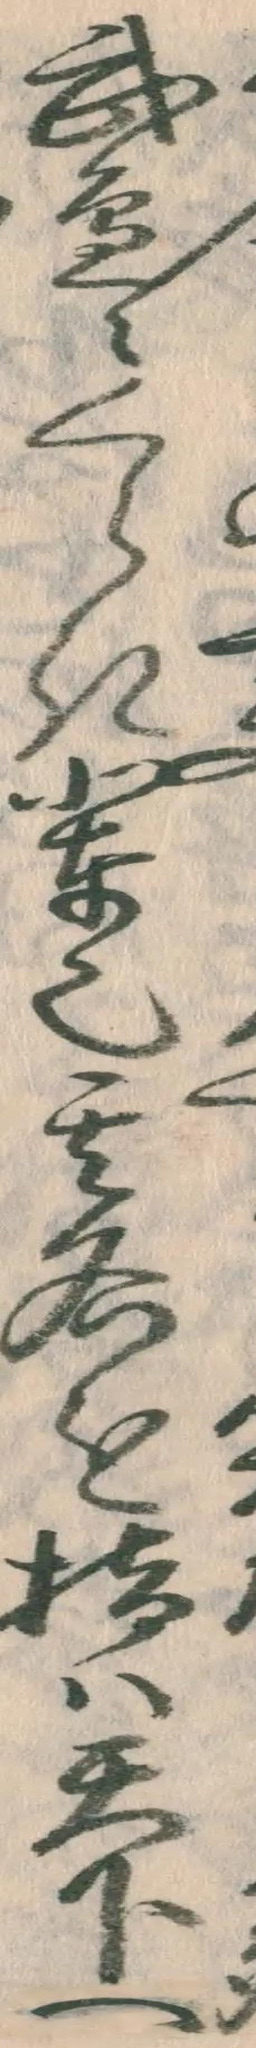武邊ニくらき輩也其各を指ハ天下へ
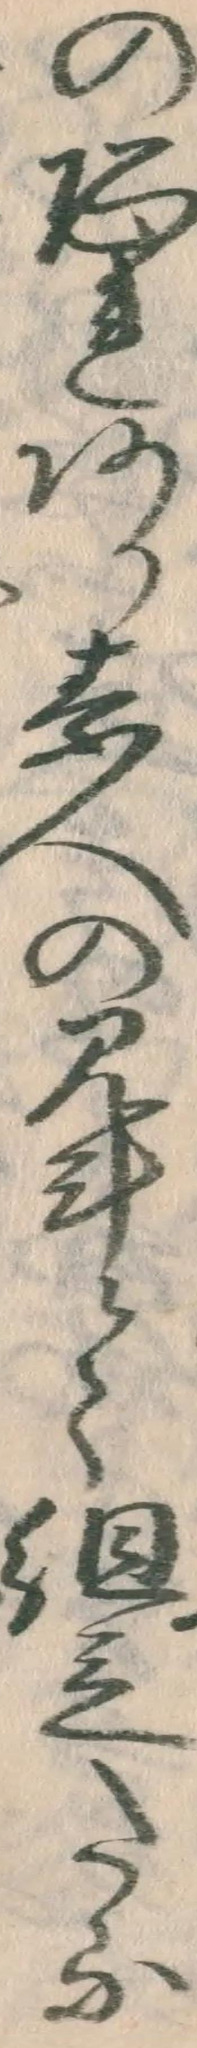の恐れあり素人の見斗ニて組立たる
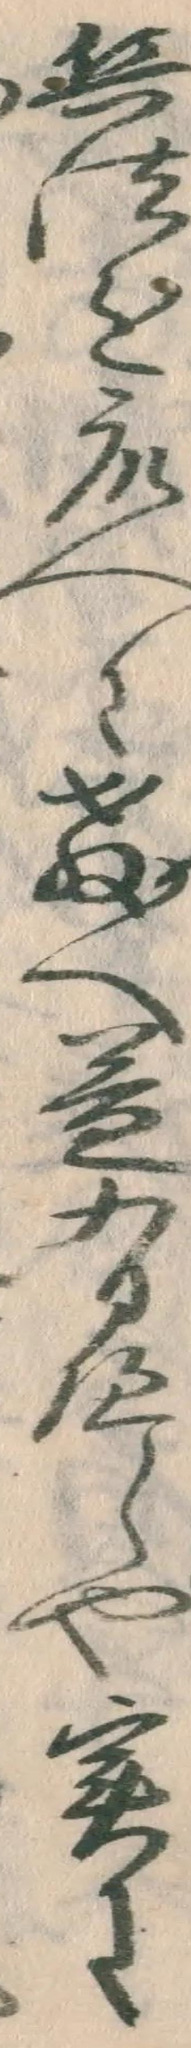兵法を衆人に教へ益有へしや実に
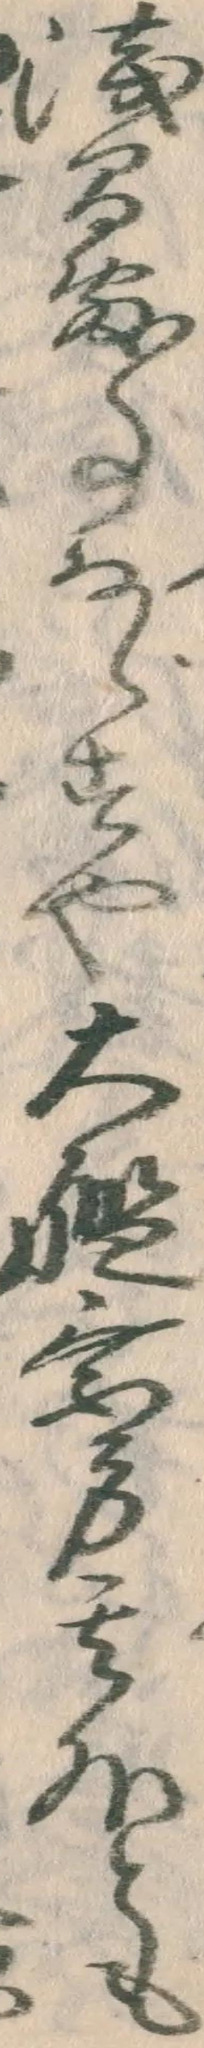浅間敷事ならすや大艦乗方其外とも
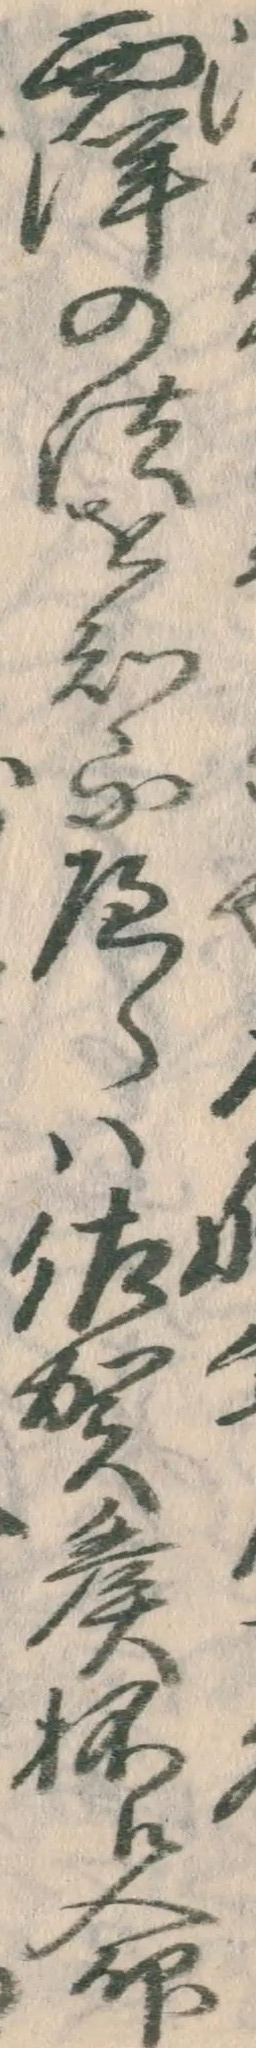西洋の法を知るへしハ佐賀侯抔江命
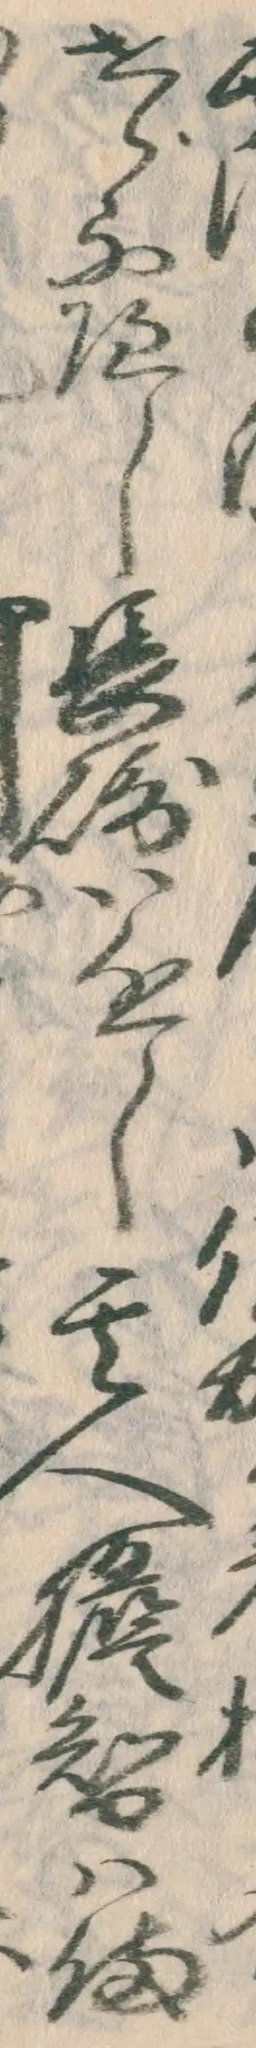せらるへし長崎ハ近し其人膽智ハ備
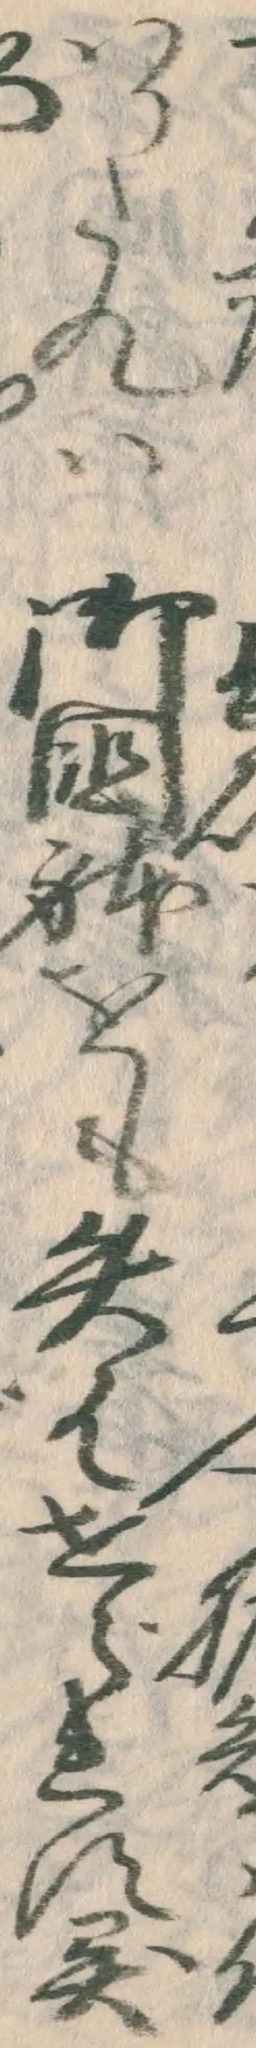ハりたれハ御国躰をも失はせられす異
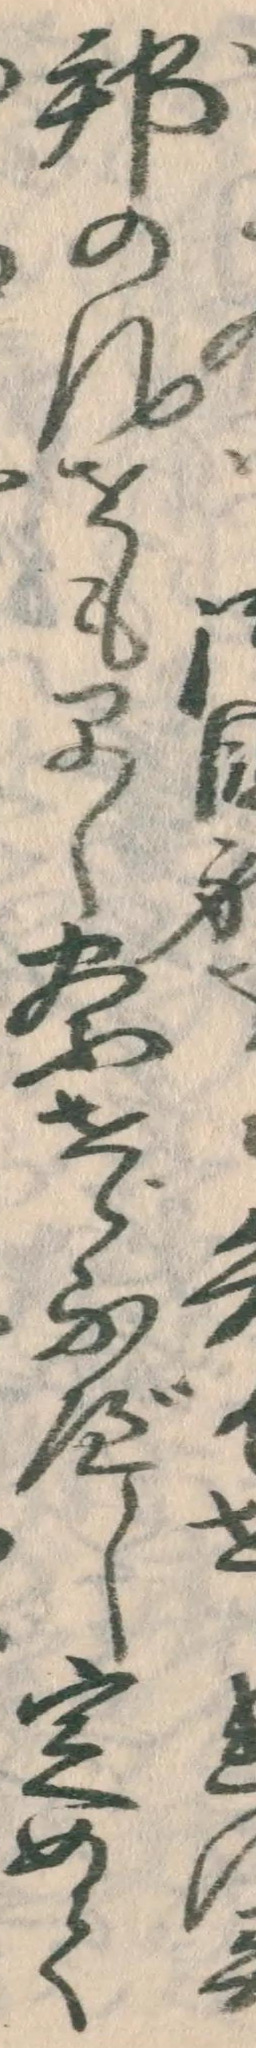邦の風をも早く察せらるべし定めて
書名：麗斎叢書. 20
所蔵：国立国会図書館 National Diet Library, JAPAN
